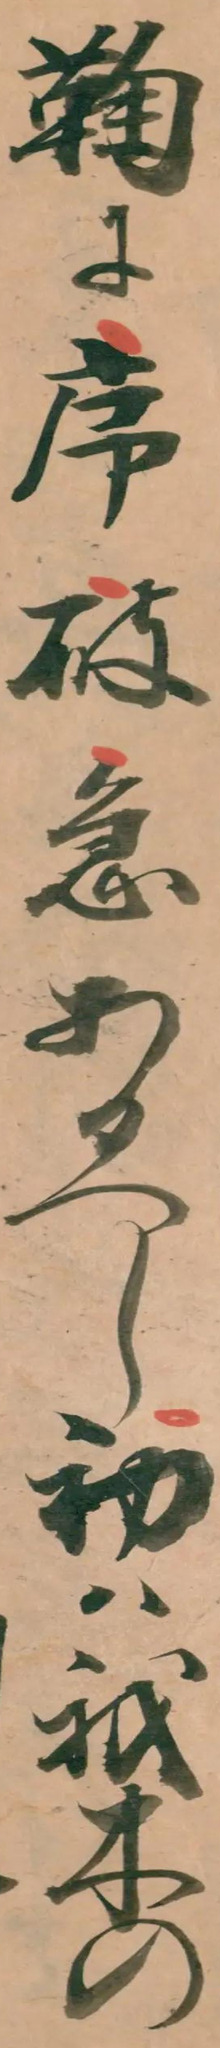鞠に序破急あるへし初ハ祇木の
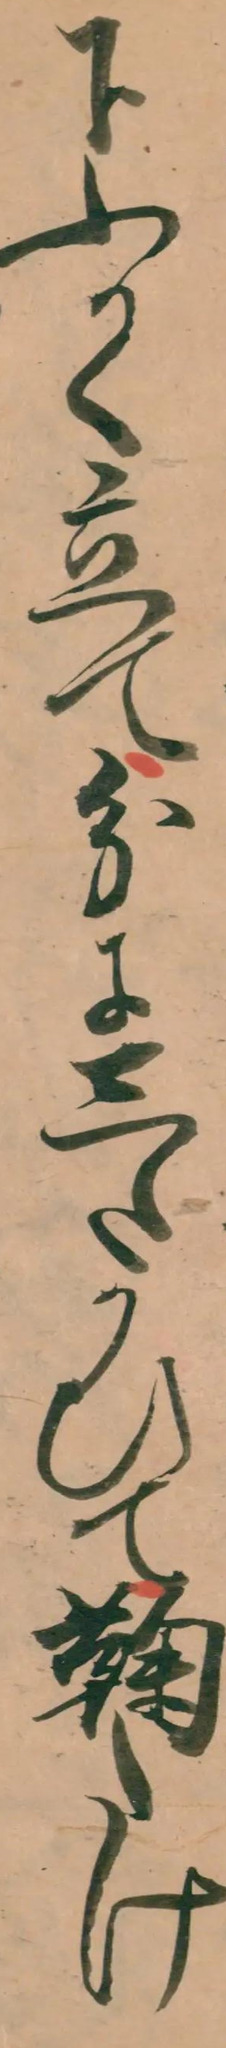下ふかく立て分にしたかひて鞠たけ
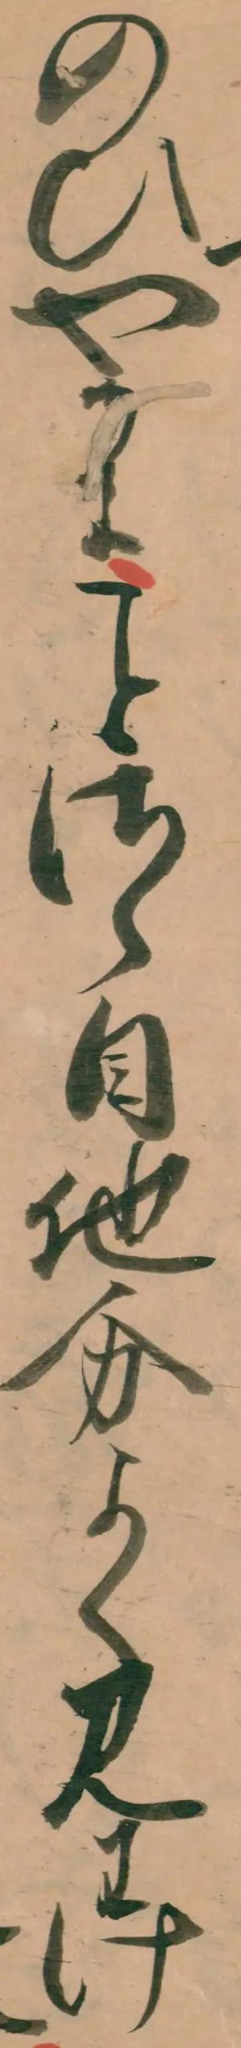のひやかにことさら自他分よく見わけて
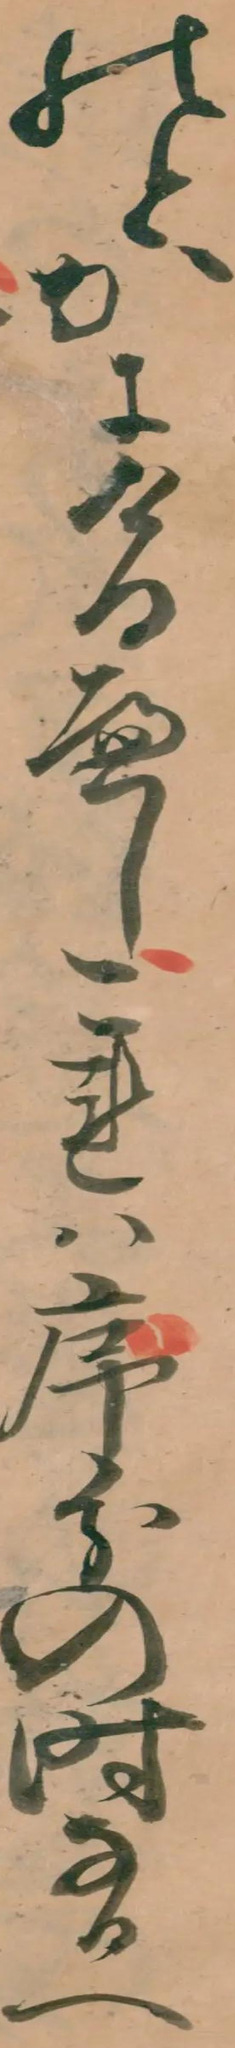のとかにけるへしこれハ序分の時なるへ
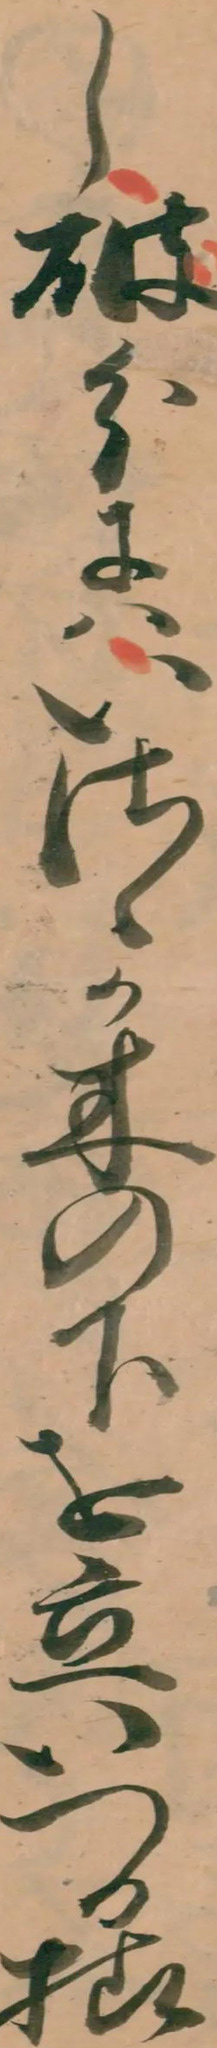し破分にハいさゝか木の下を立ハつる様
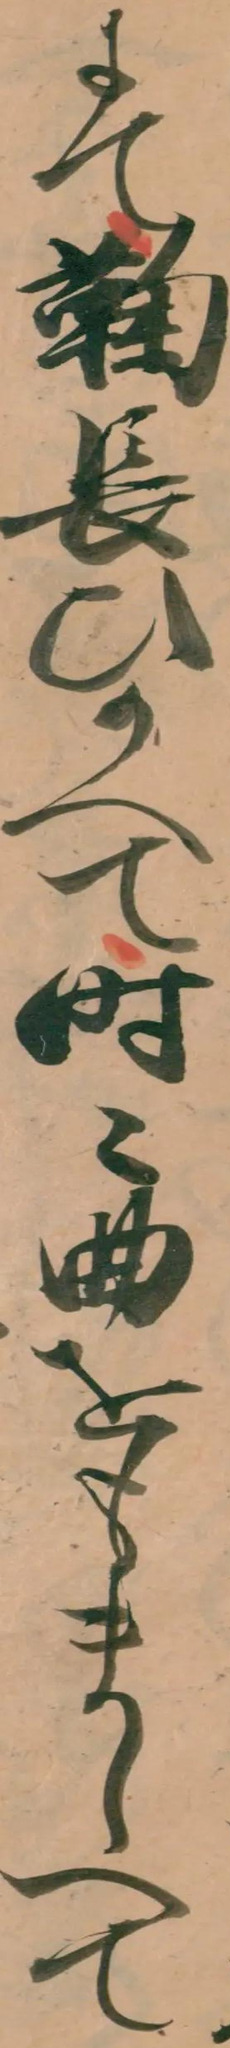にて鞠長ひかへて時々曲をもましへて
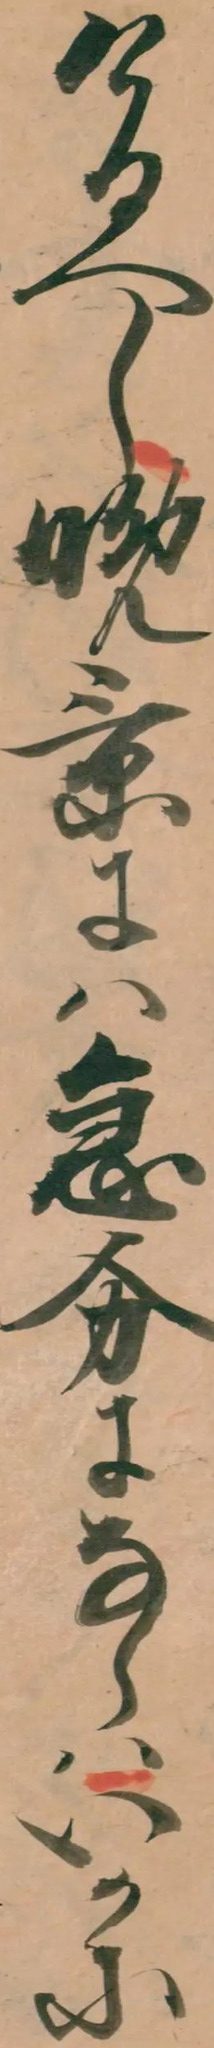けるへし晩景にハ急分にならハいかに
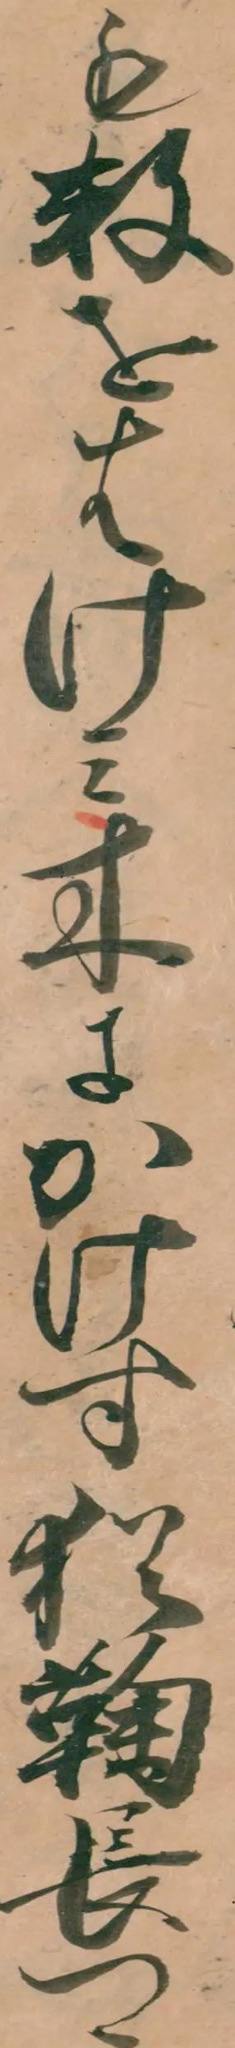も数をはけミ木にかけす猶鞠長つゝ
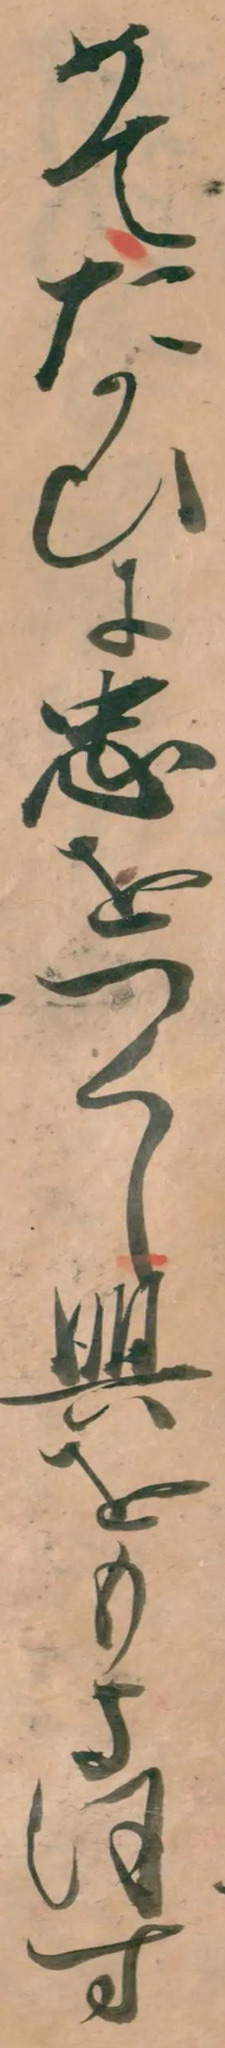めてたかひに忠をつくし興をもよほす
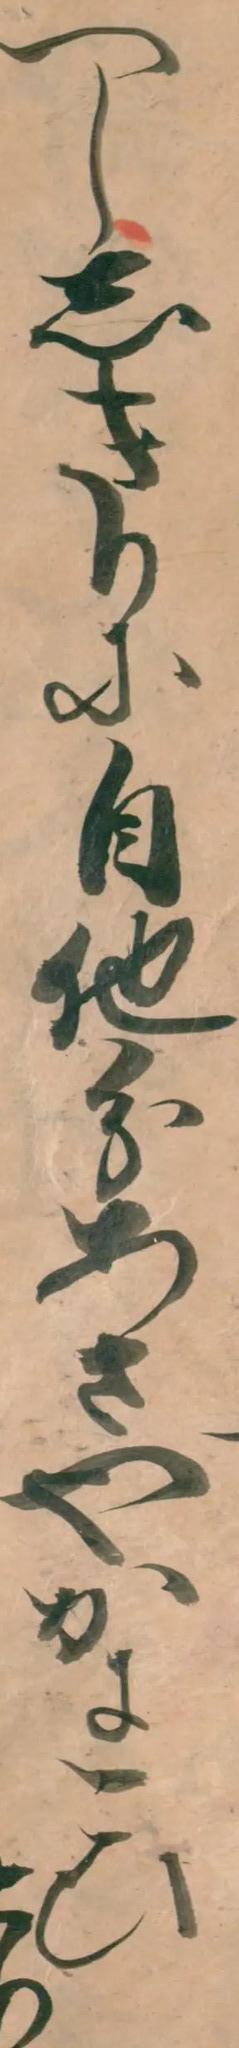へししきりに自他分あさやかにこひとり
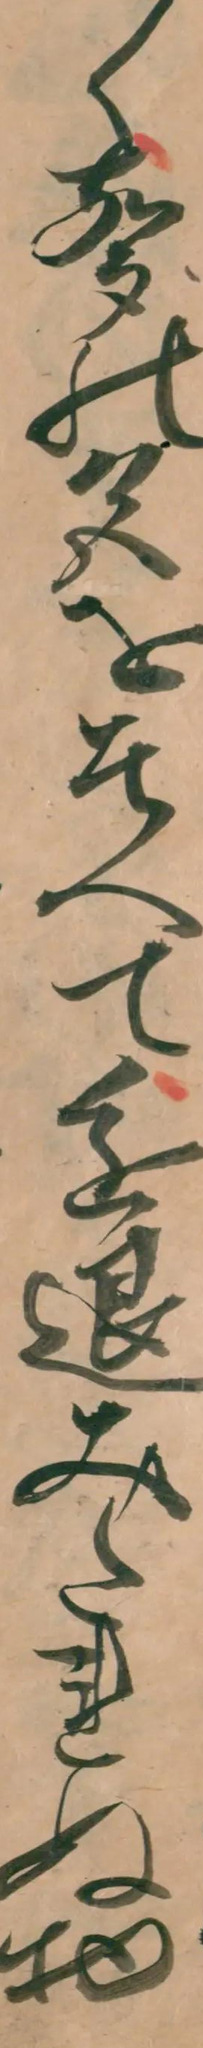〳〵声の色をそへて進退みたれぬ物
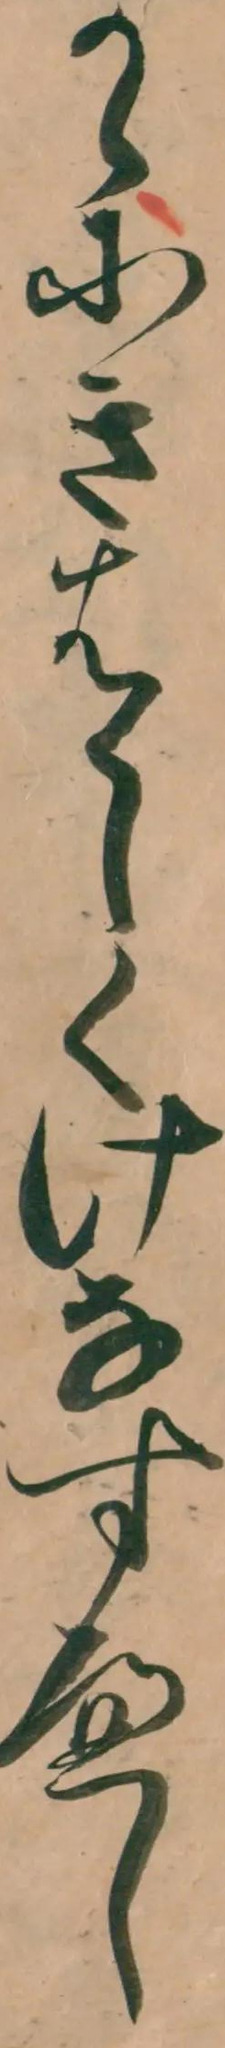からにきはゝしくけなすへし

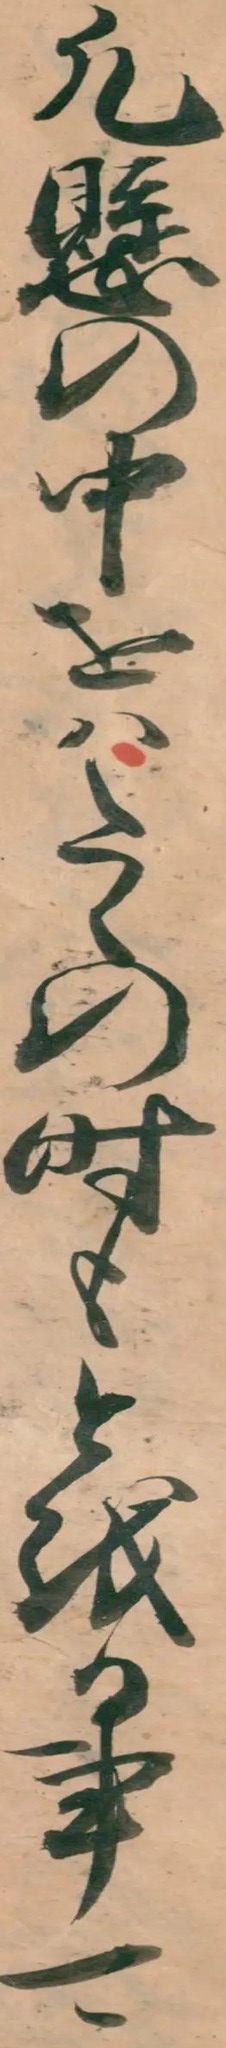凡懸の中をハたゝの時もとをる事可
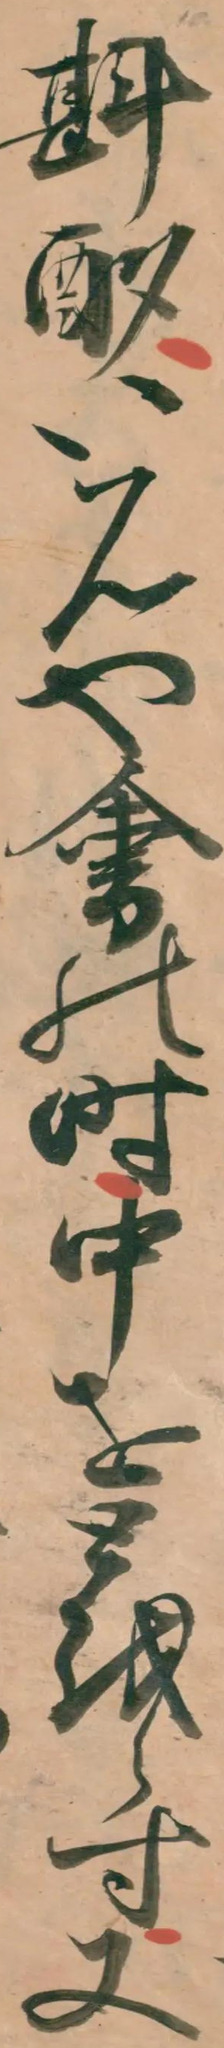斟酌いハんや会の時中をとをらす又
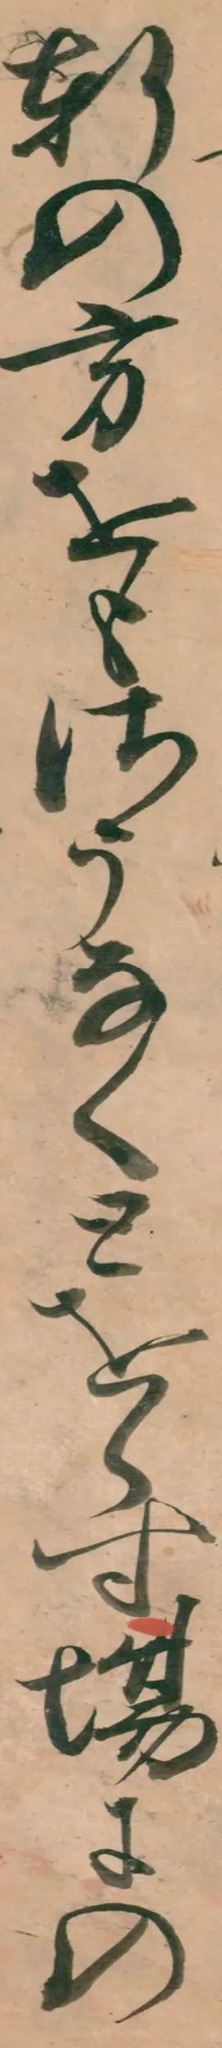軒の方をもさうなくとをらす場にの
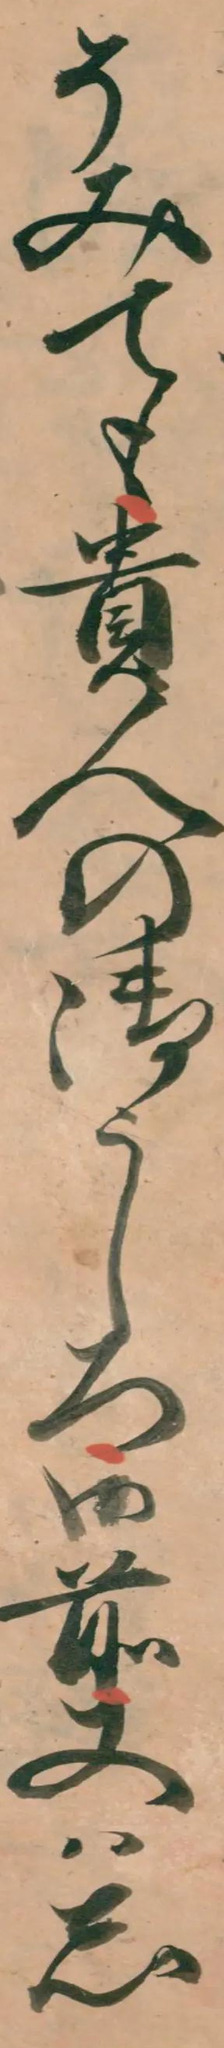そみても貴人の御うしろ御前又ハし
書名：蹴鞠之条々大概
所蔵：国立国会図書館 National Diet Library, JAPAN
